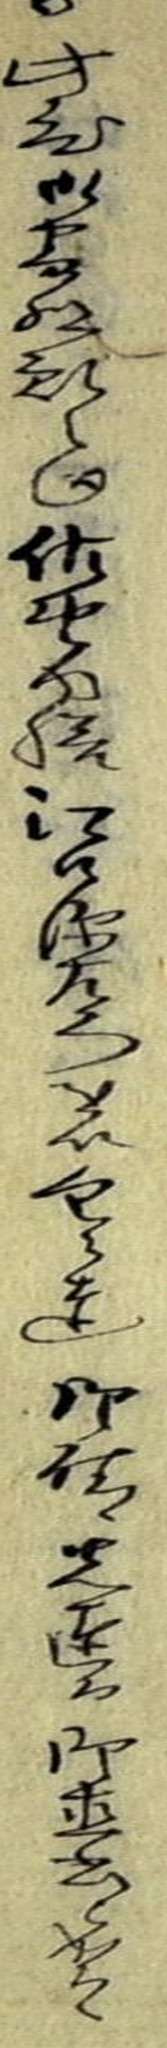○此度御番組願之趣佐野内膳江口源左衛門を以色々達御聴に先達而御直書被成下候
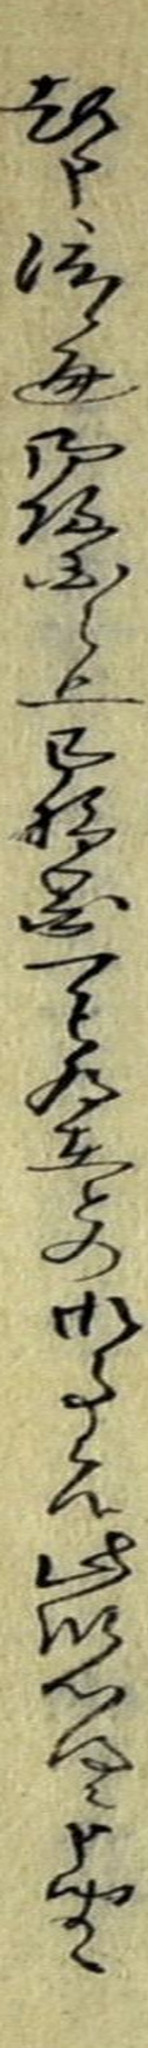趣申渡候通御帰国之上御指図可被為在との御事に候此段心得に申聞候
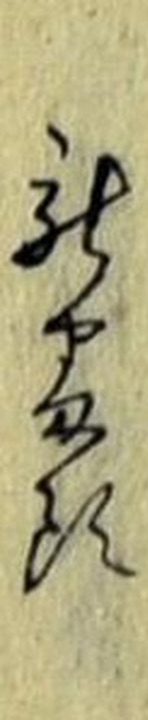新番頭

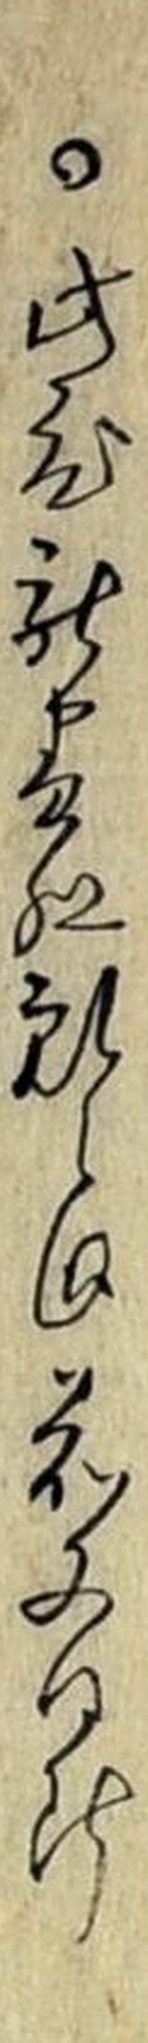○此度新番組願之趣前文同断
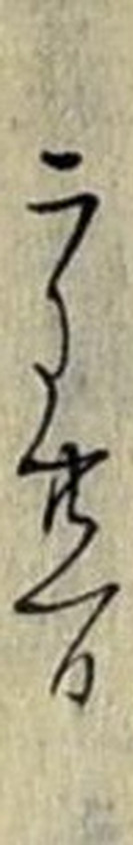二月廿一日
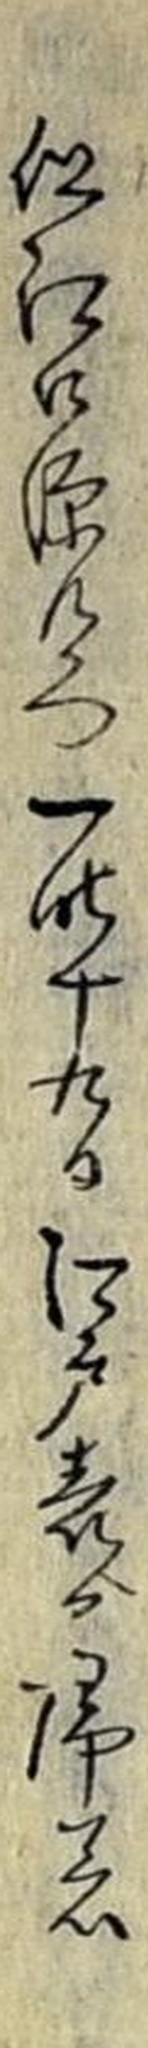但江口源左衛門一昨十九日江戸表ゟ帰着
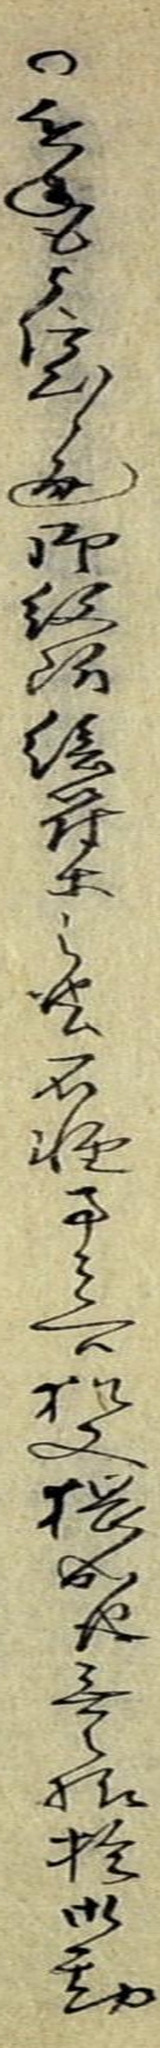○近年も被仰出候通御紋附絵符等之儀は不軽事に候へは猶又猥成義無之様於御勘
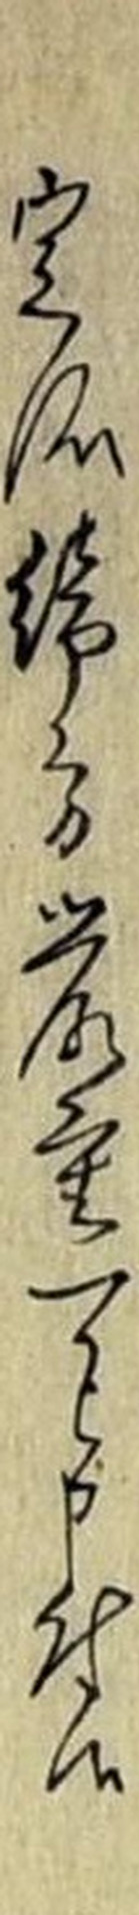定所締方厳重可被申付候
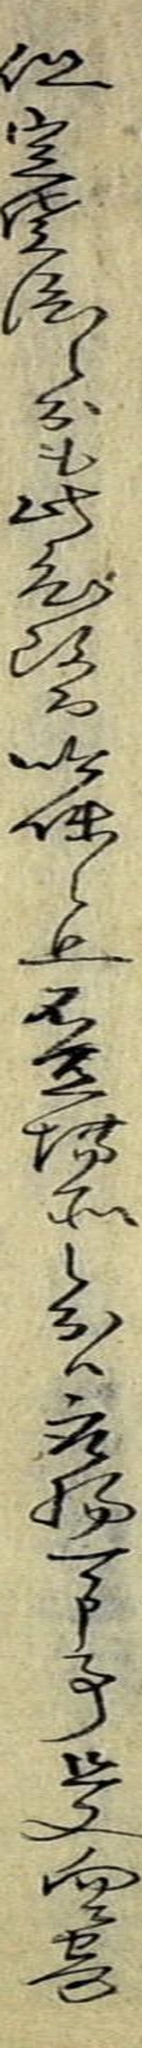但定貸渡し分も此度改而吟味之上不宜場所之分は取揚可申事且又向に寄
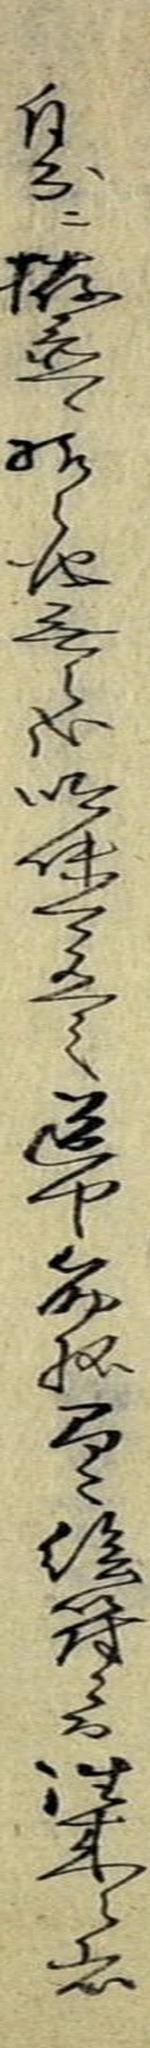自分に拵置候様之儀無之哉吟味可有之道中筋抔間々絵符に而往来候者
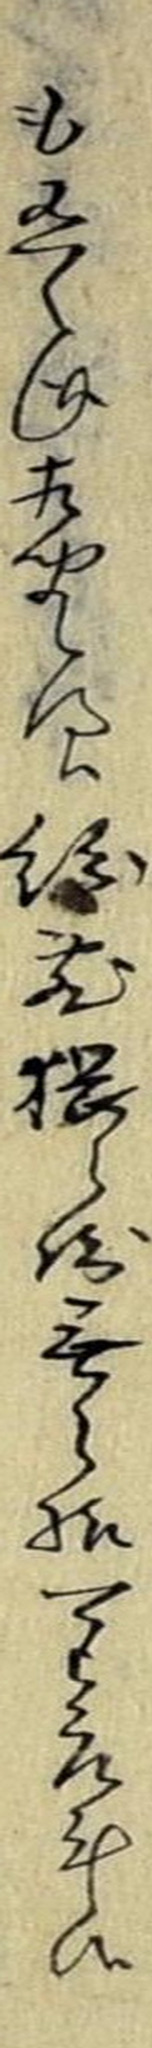も有之趣相聞候得は紛敷猥之儀無之様可被取斗候
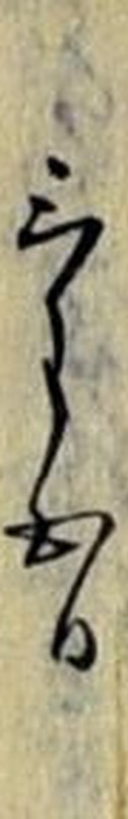三月五日
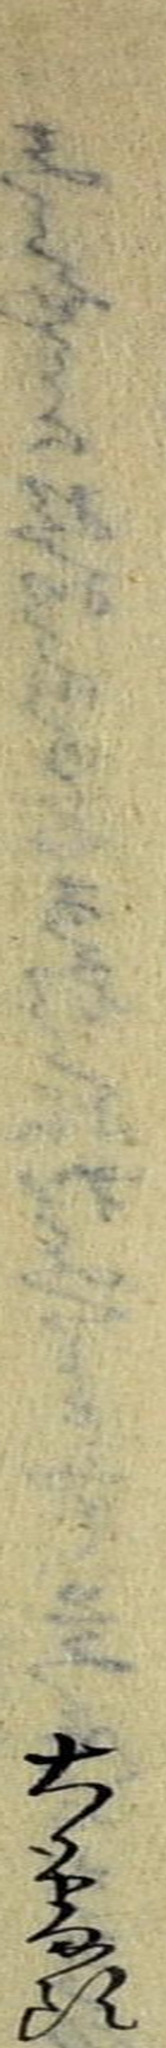大御番頭
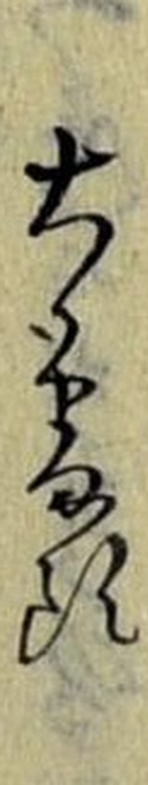大御番頭
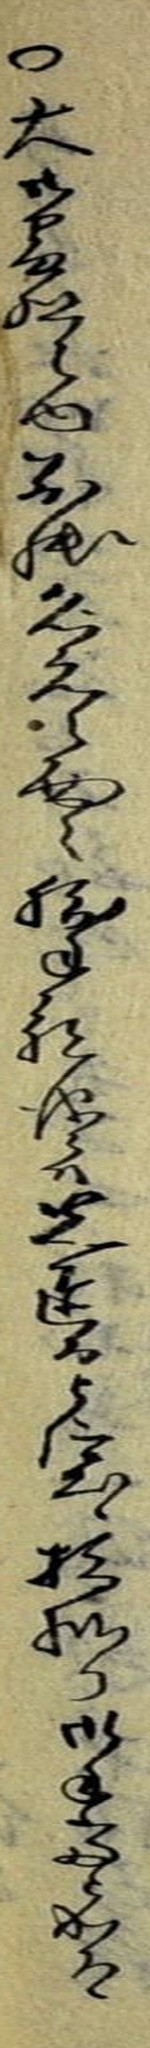○大御番組之内別紙名元之面々勝手難儀に付先達而被仰出候指掛り御手当被成下候
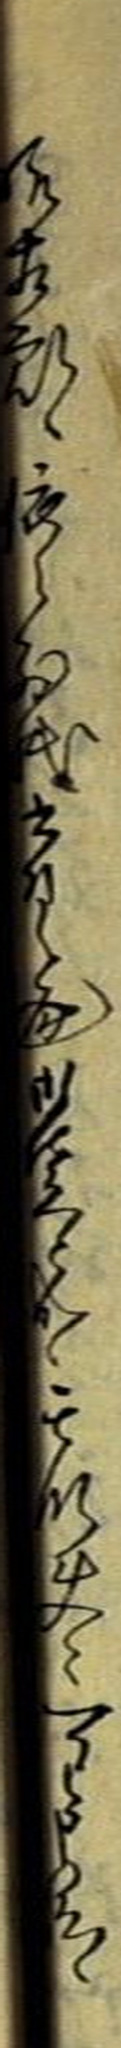様相願候依之別紙書付之通御貸被成其段夫々可被申渡候
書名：命令之部 四
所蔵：福井県文書館 Fukui Prefectural Archives
